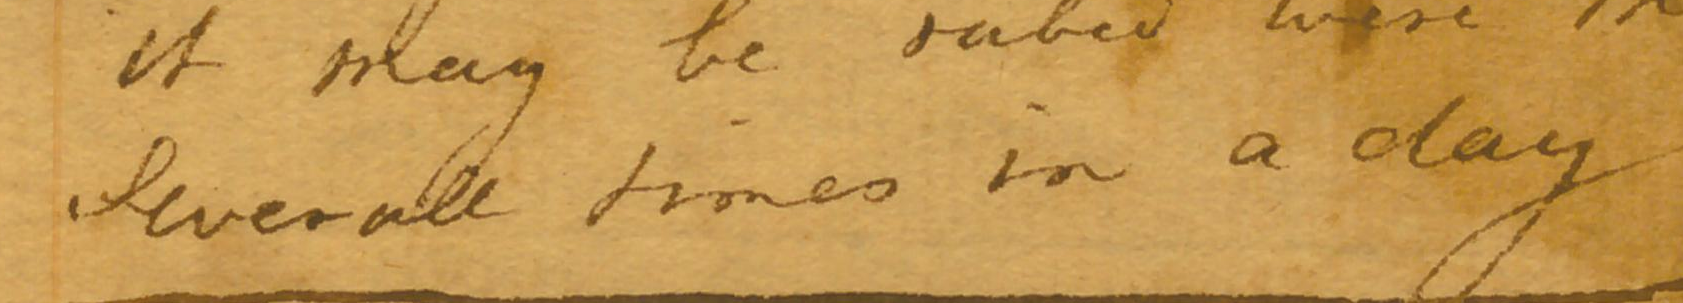severall times in a day
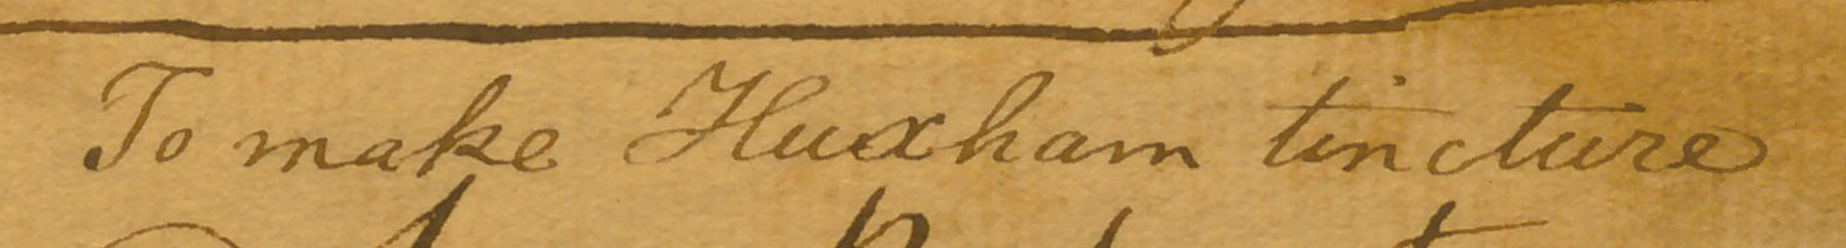To make Huxham tincture
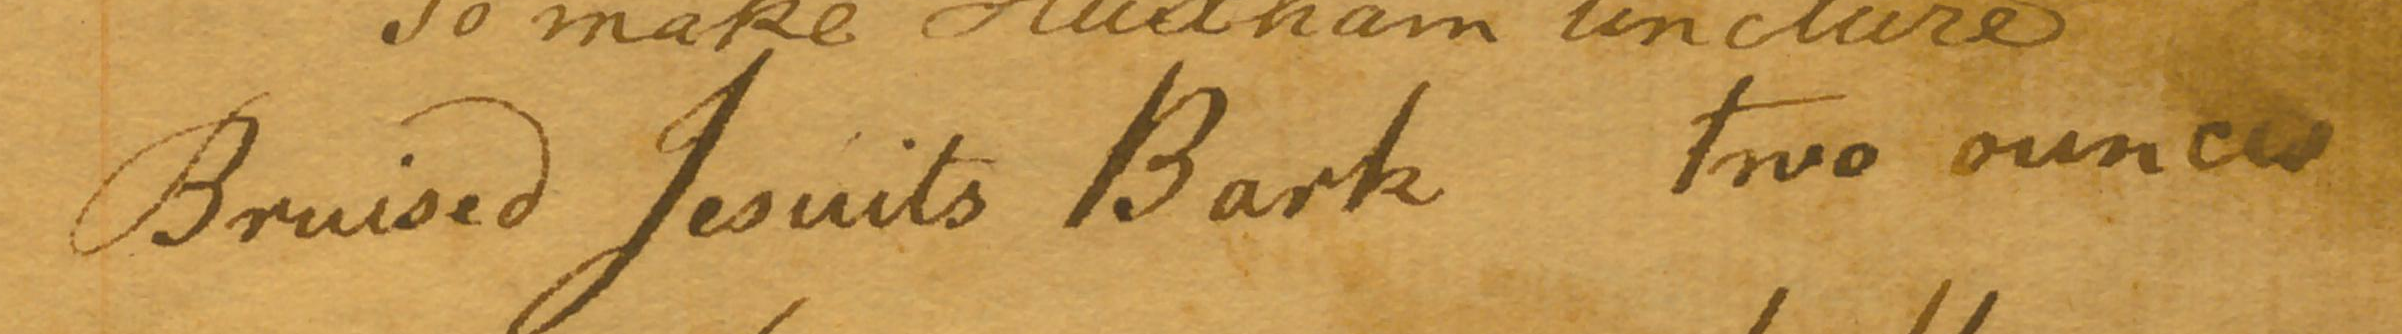Bruised Jesuits Bark two ounces
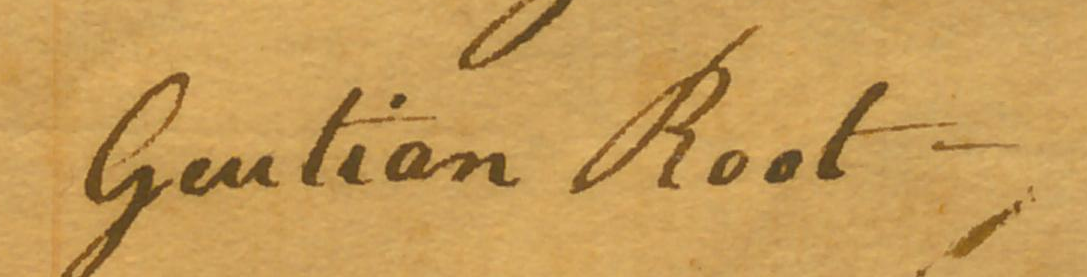Gentian Root-
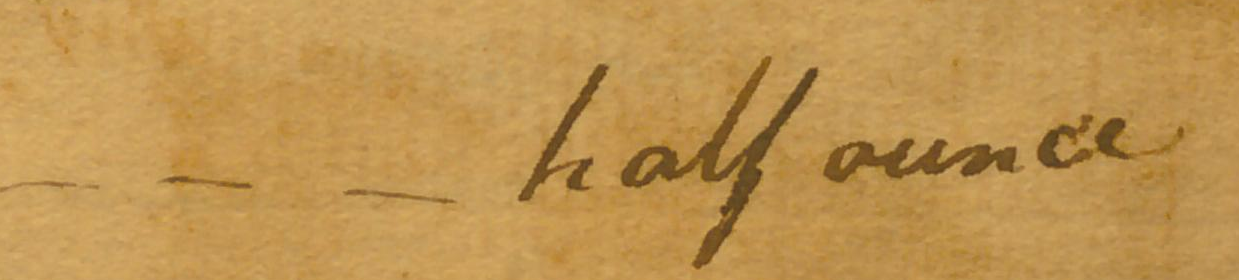--- half ounce
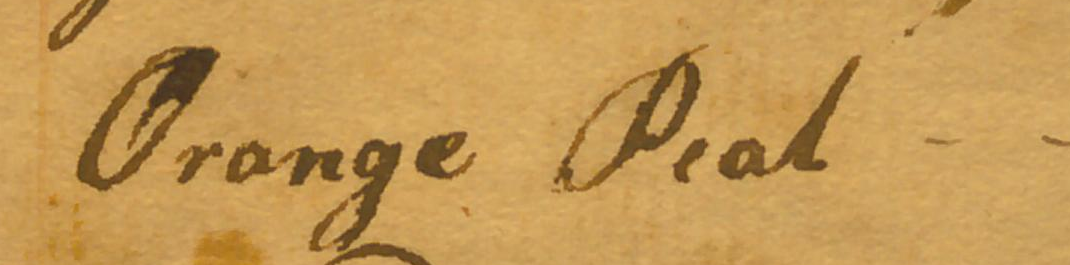Orange Peal-
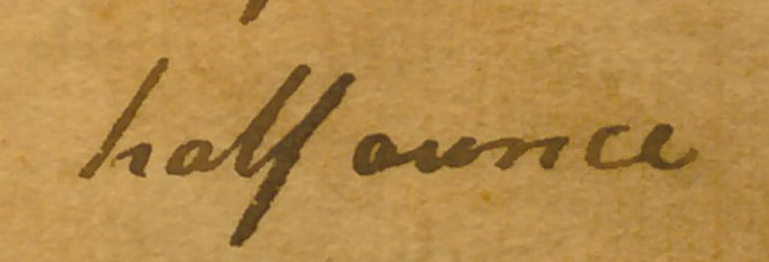half ounce
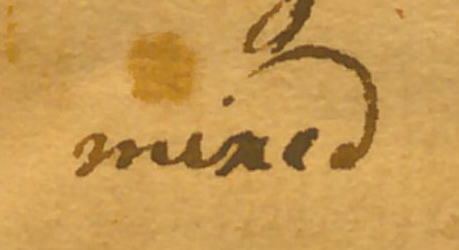mixed
